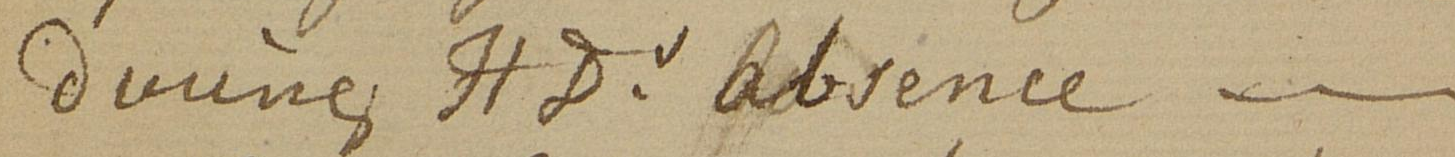during H D^s. absence-
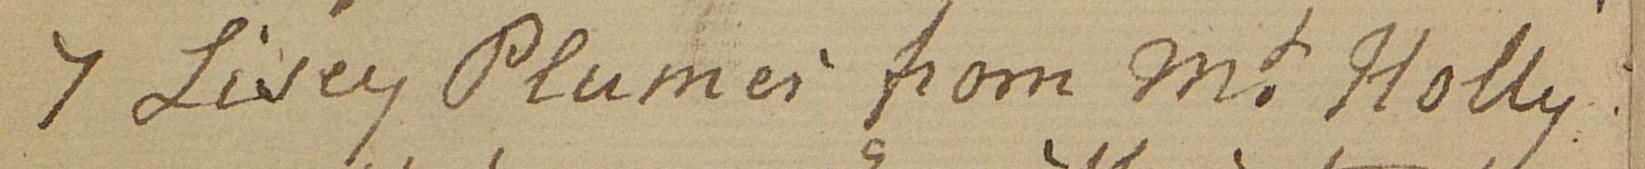7 Lisey Plumer from M^t Holly
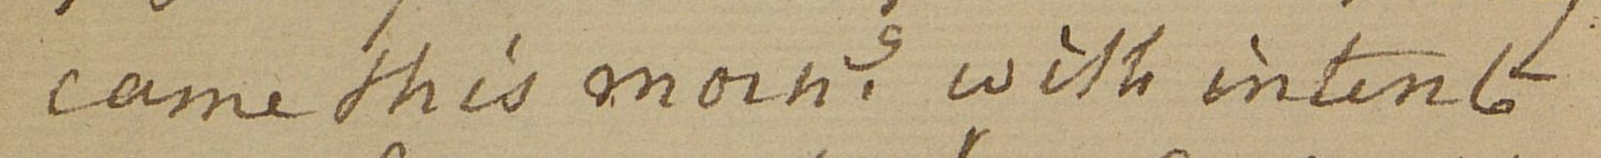came this morn^g. with intent
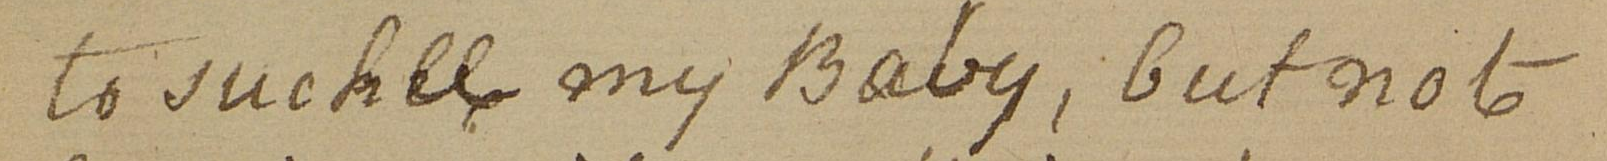to suckel my Baby, but not
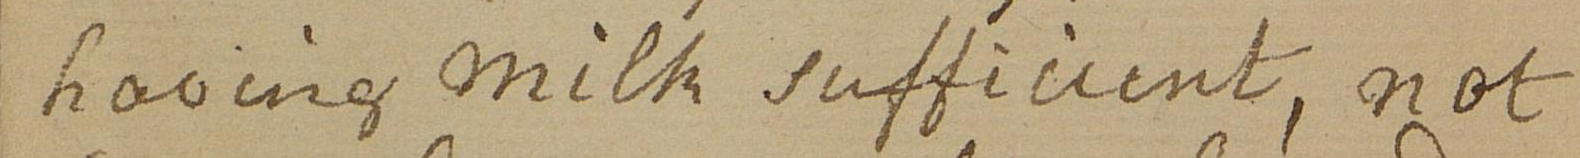having milk sufficient, not
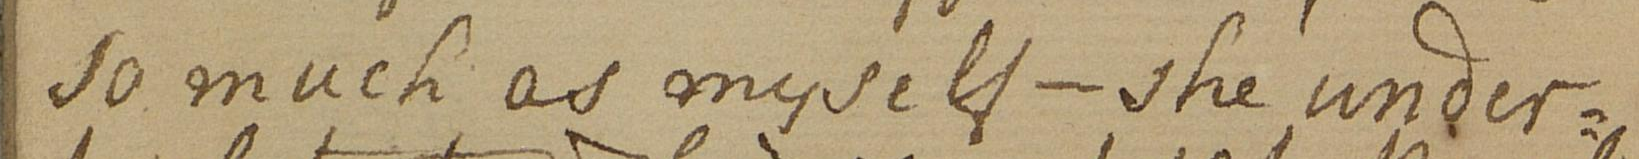So much as myself- she under-
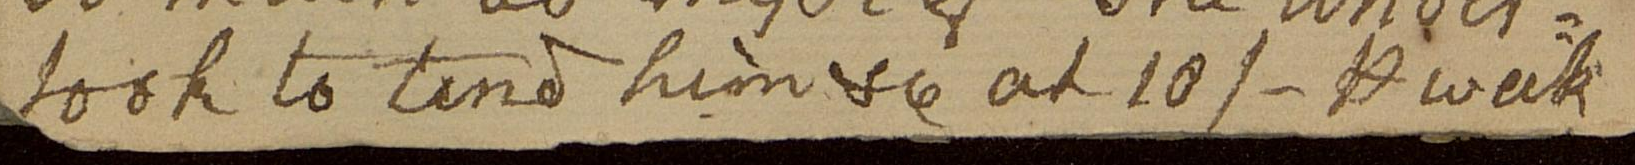took to tend him &c at 10s- per week
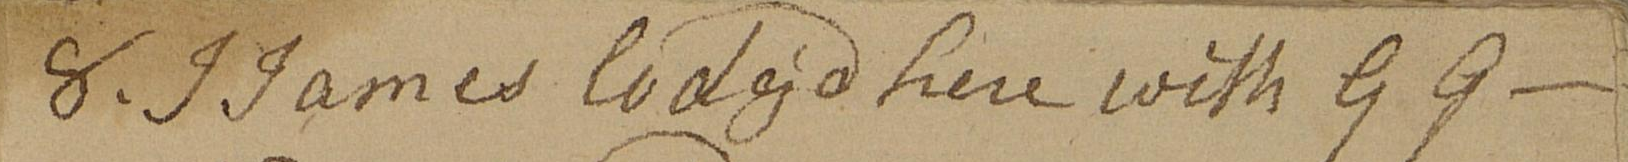8. J James lodg'd here with GG-
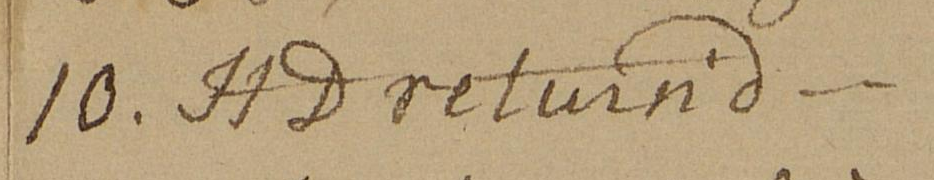10. HD return'd-
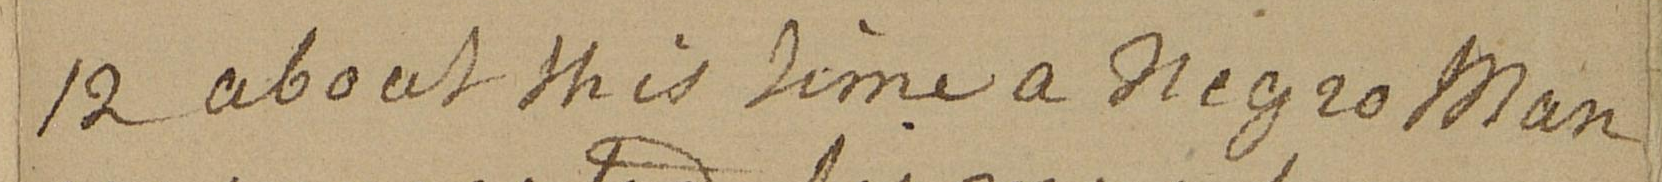12 about this time a Negro Man
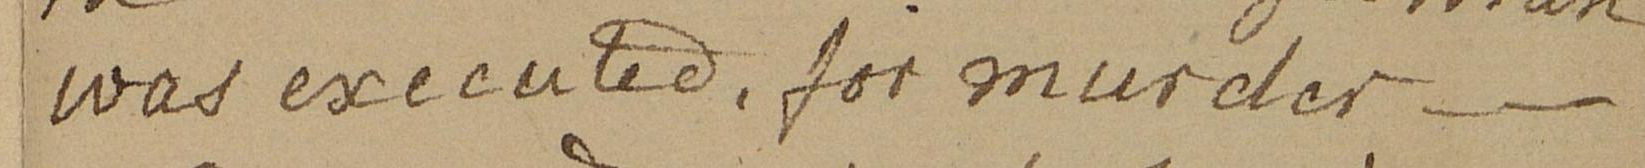was executed, for murder-
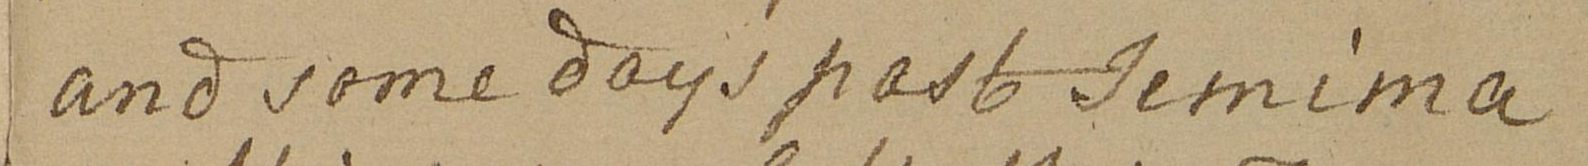and some says past Jemima
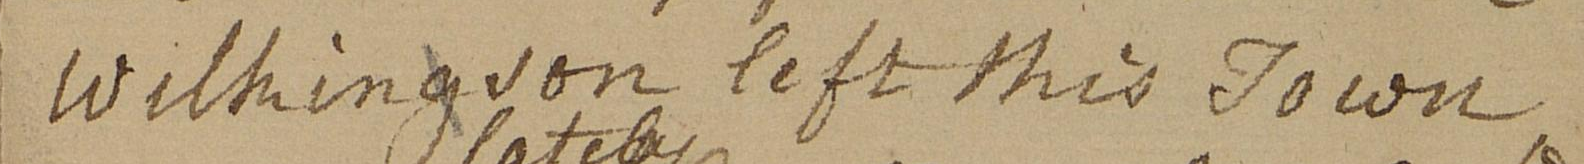Wilkingson left this Town
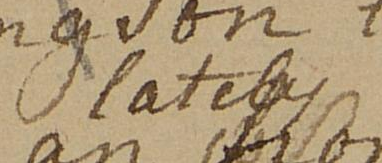lately
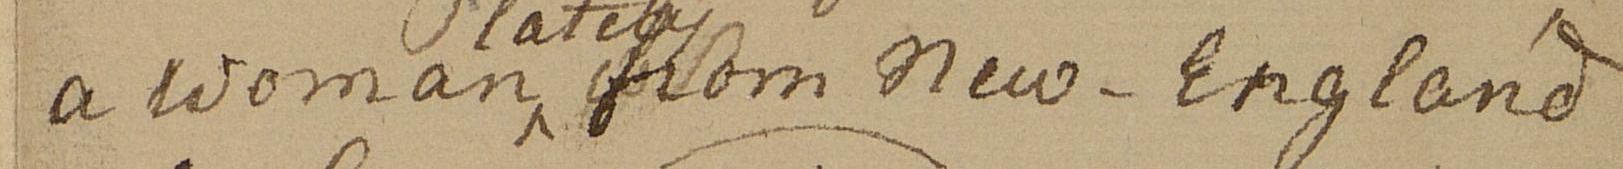a woman, from New- England
